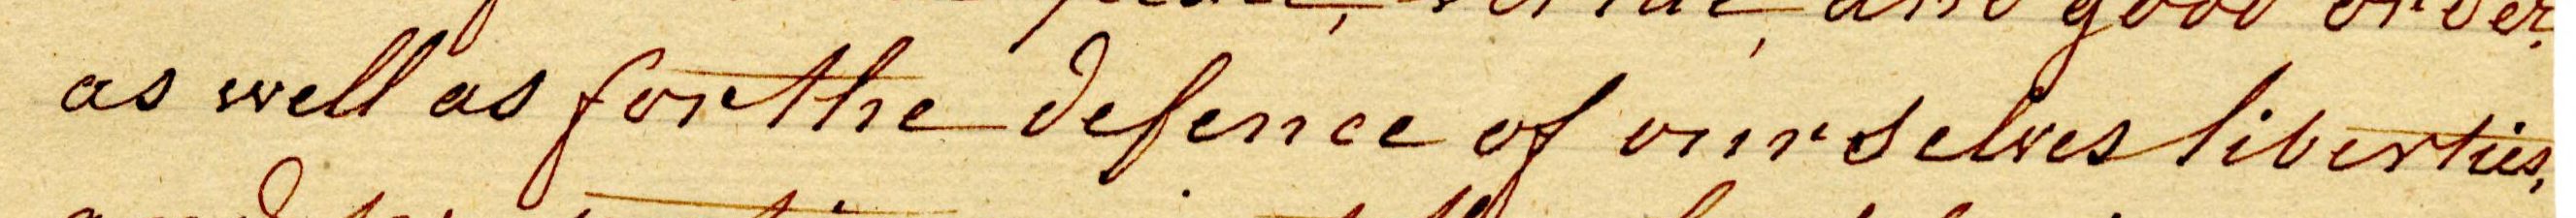as well as for the defence of ourselves liberties,
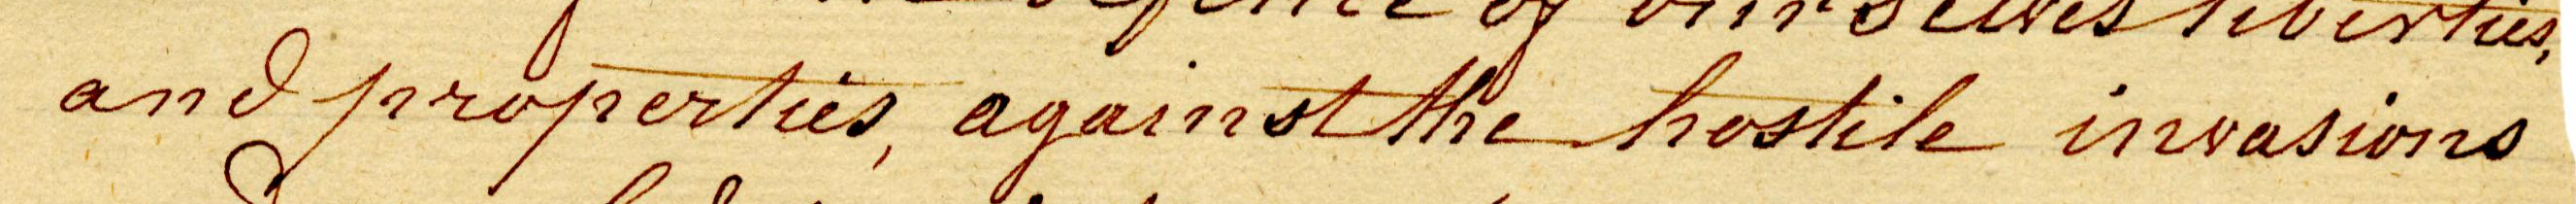and properties, against the hostile invasions
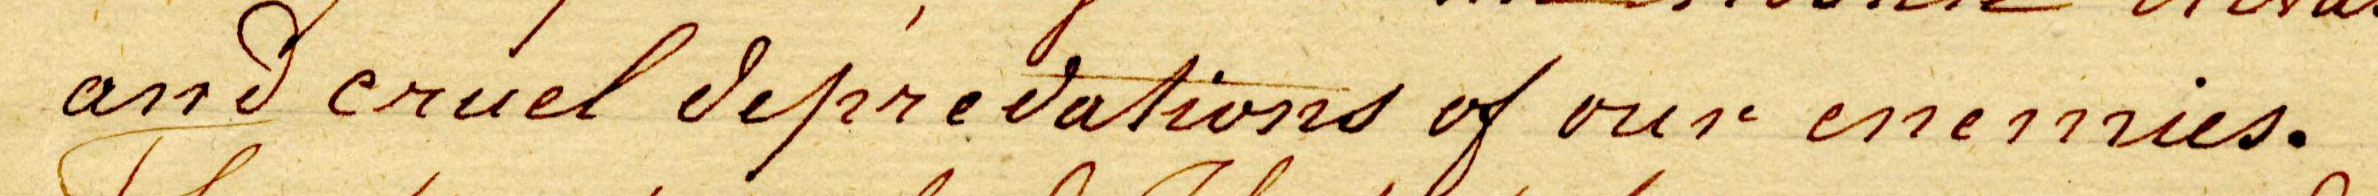and cruel depredations of our enemies.
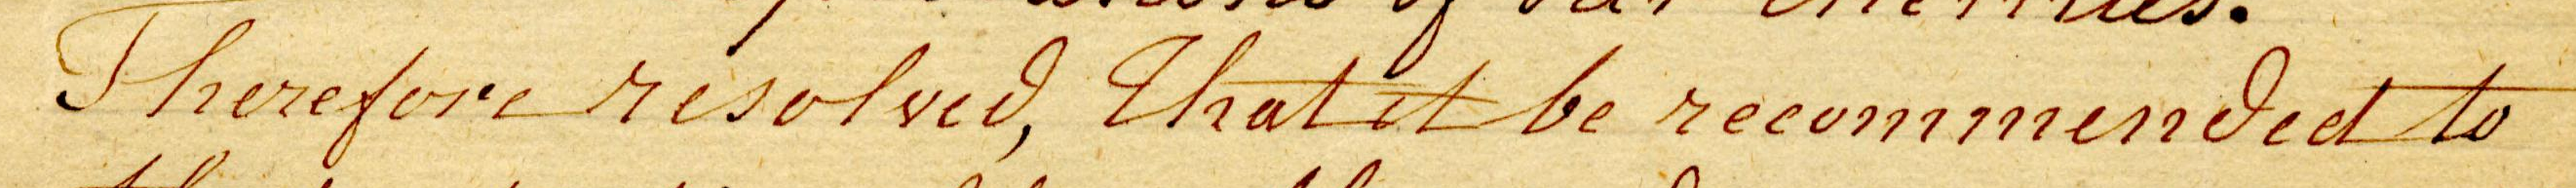Therefore resolved, That it be recommended to
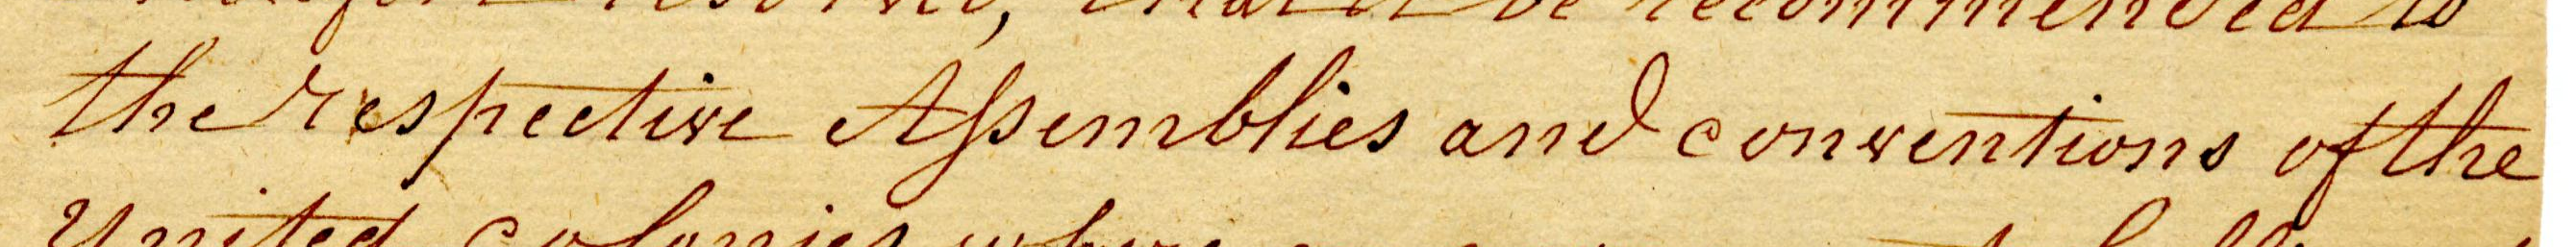the respective Assemblies and conventions of the
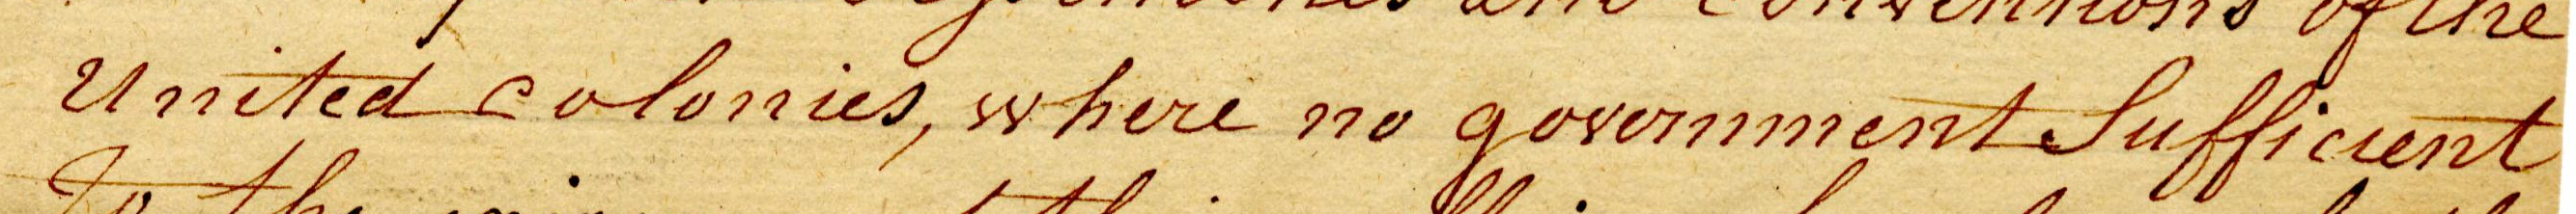united colonies, where no government sufficient
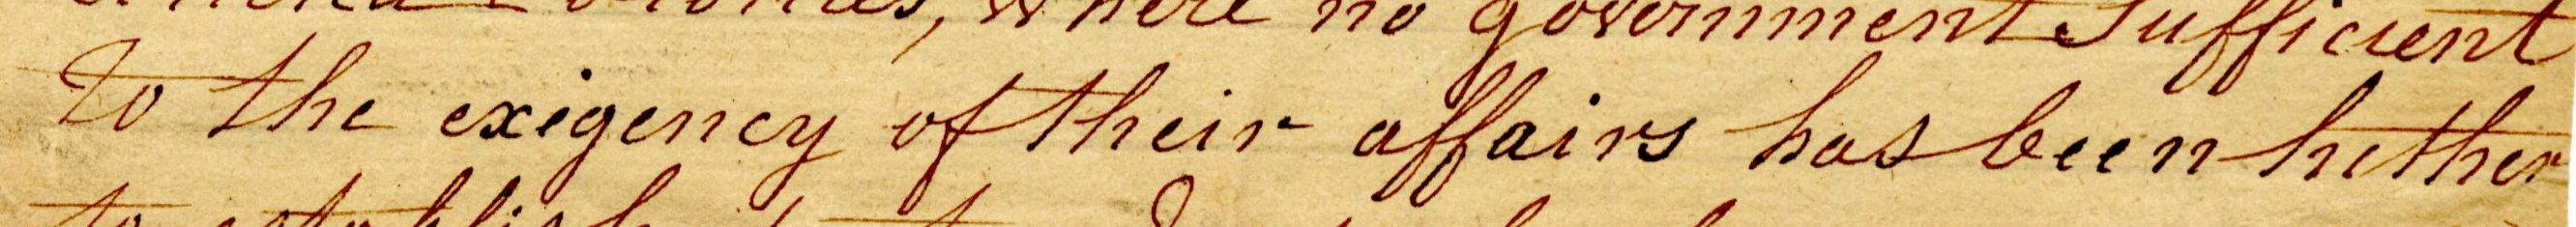To the exigency of their affairs has been hither
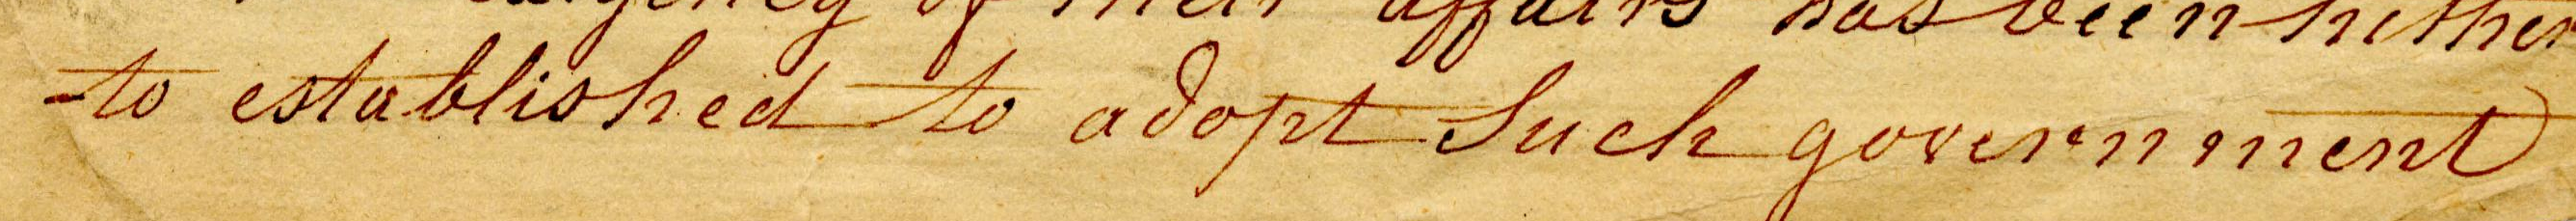-to established to adopt such government
